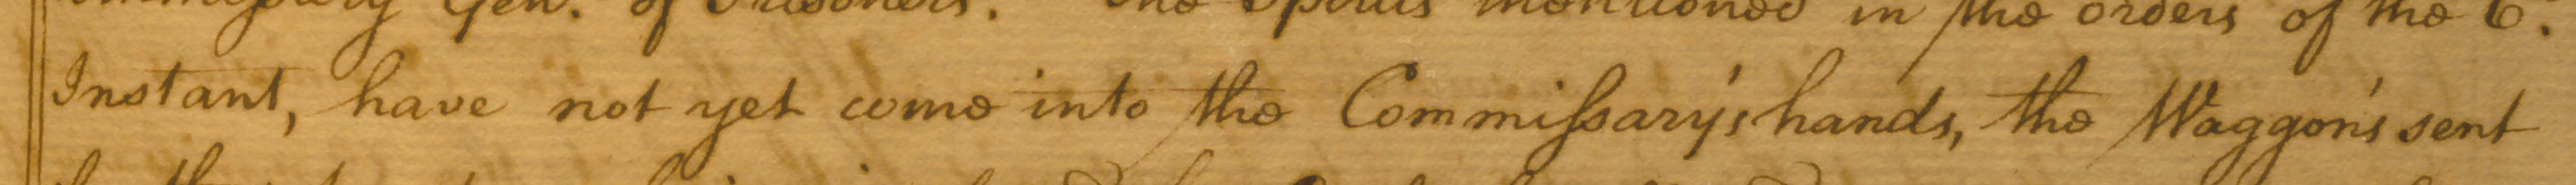Instant, have not yet come into the Commissary's hands, the Waggon's sent
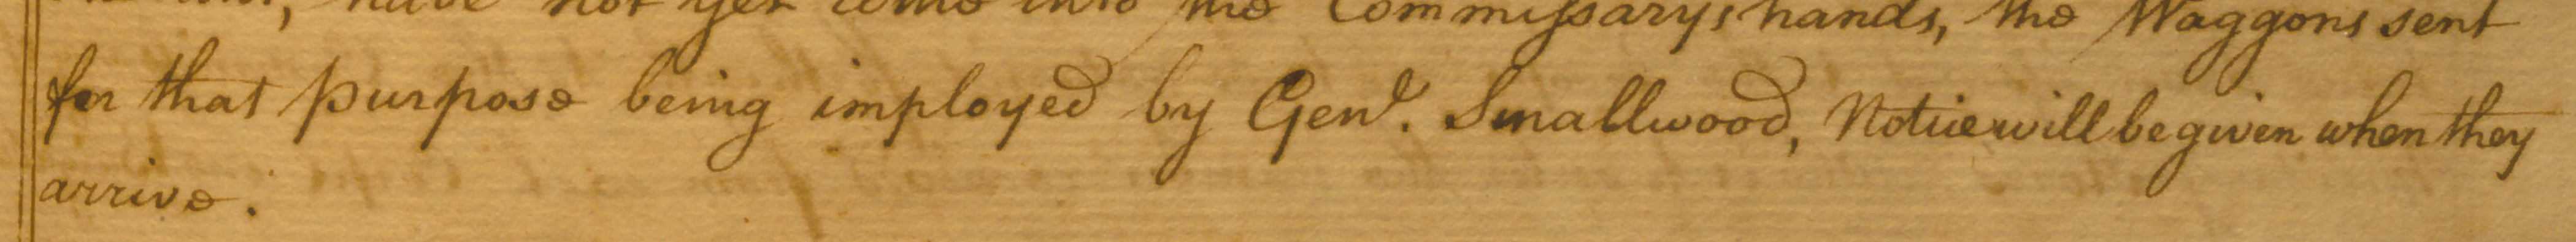for that purpose being imployed by Gen^l. Smallwood, Notice will be given when they
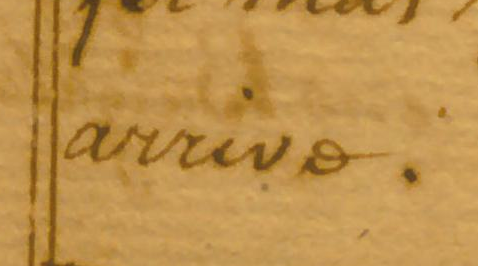arrive.
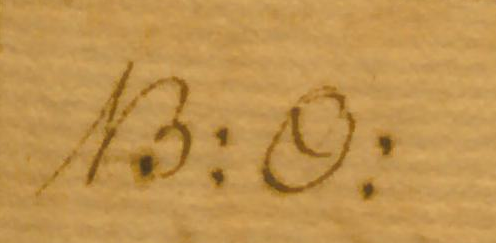B: O:
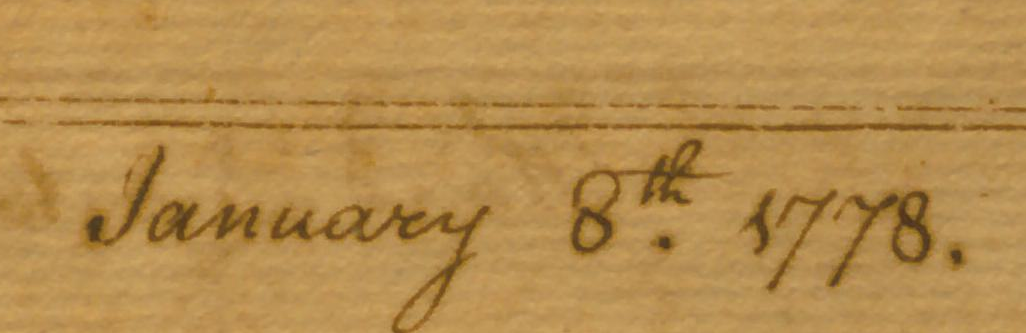January 8^th. 1778.
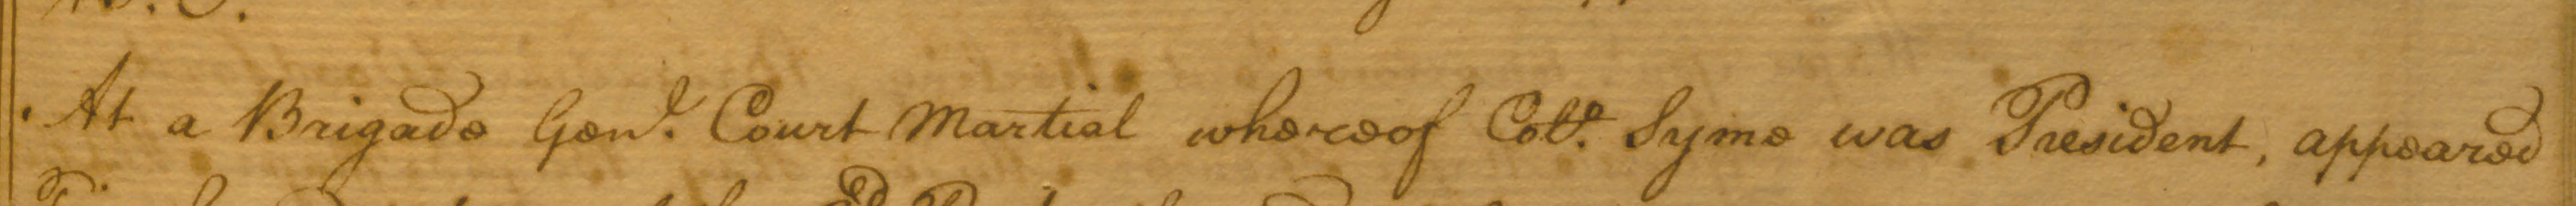At a Brigade Gen^l. Court Martial whereof Col^o. Syms was President, appeared
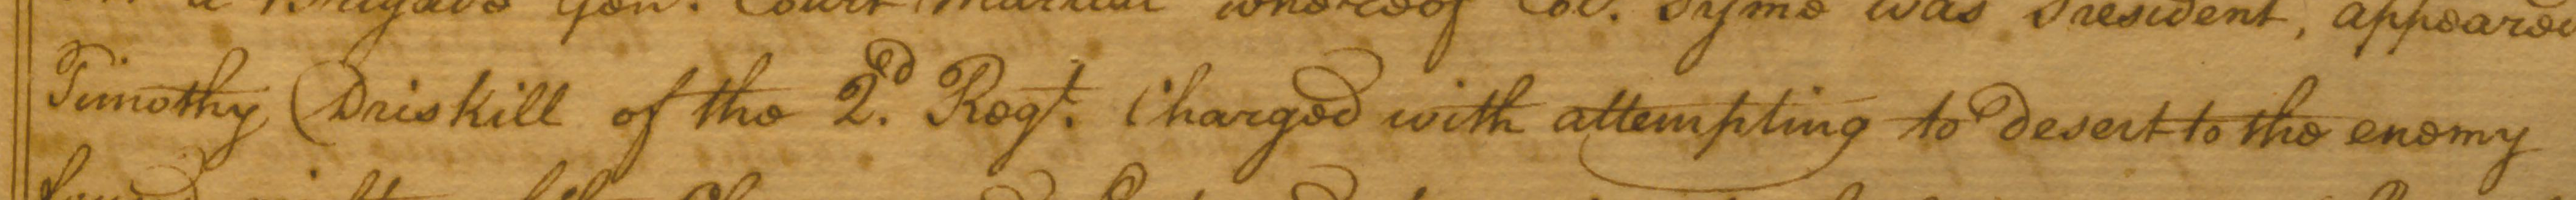Timothy Driskill of the 2^d. Reg^t. Charged with attempting to desert to the enemy
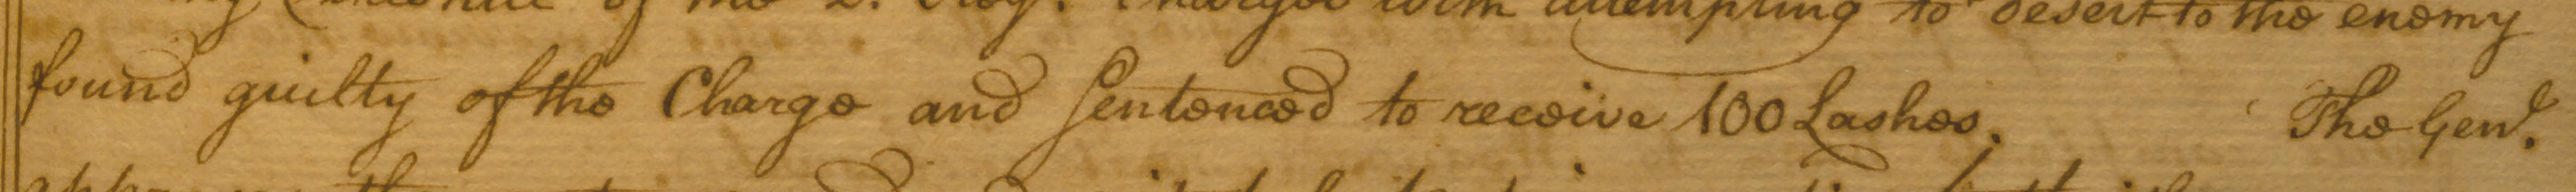found guilty of the Charge and sentenced to receive 100 Lashes. The Gen^l.
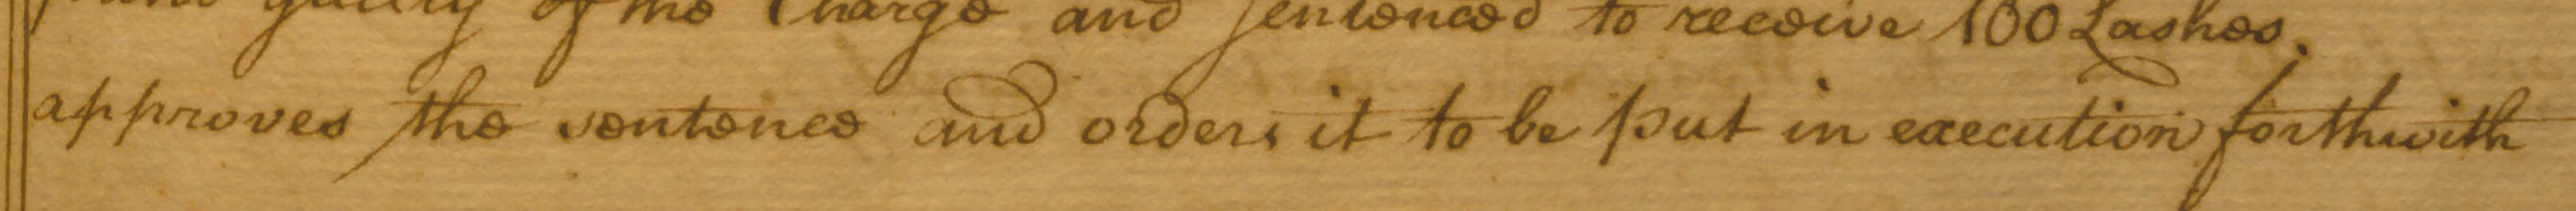approves the sentence and orders it to be put in execution forthwith
